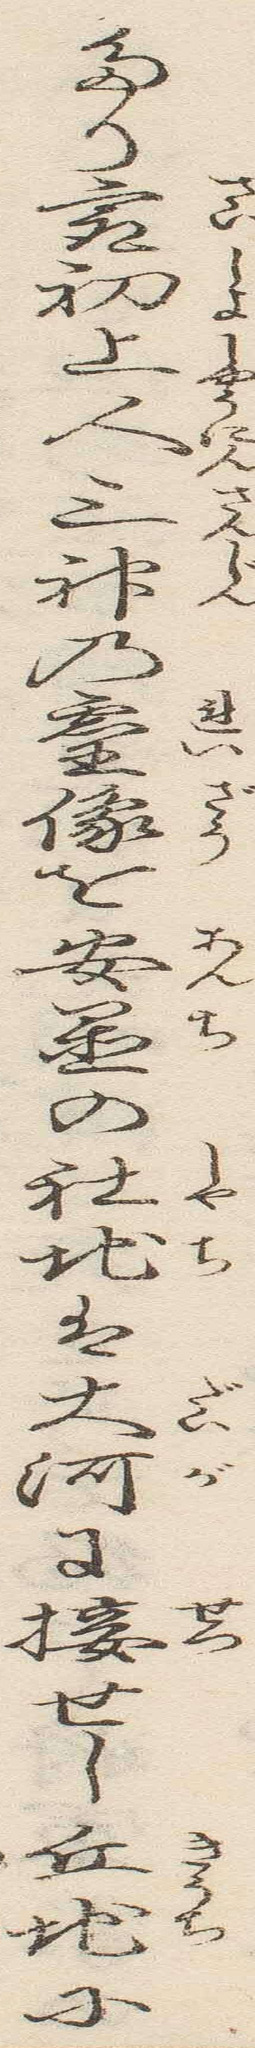たり最初上人三神の靈像を安置の社地は大河に接せし丘地に
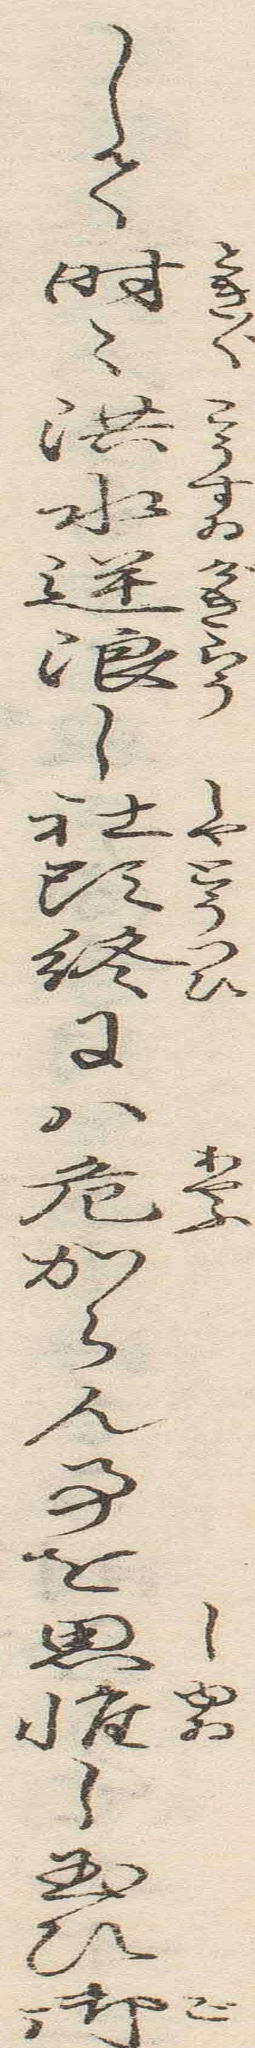して时〻洪水逆浪し社頭終には危からん事を思惟し玉ひ御
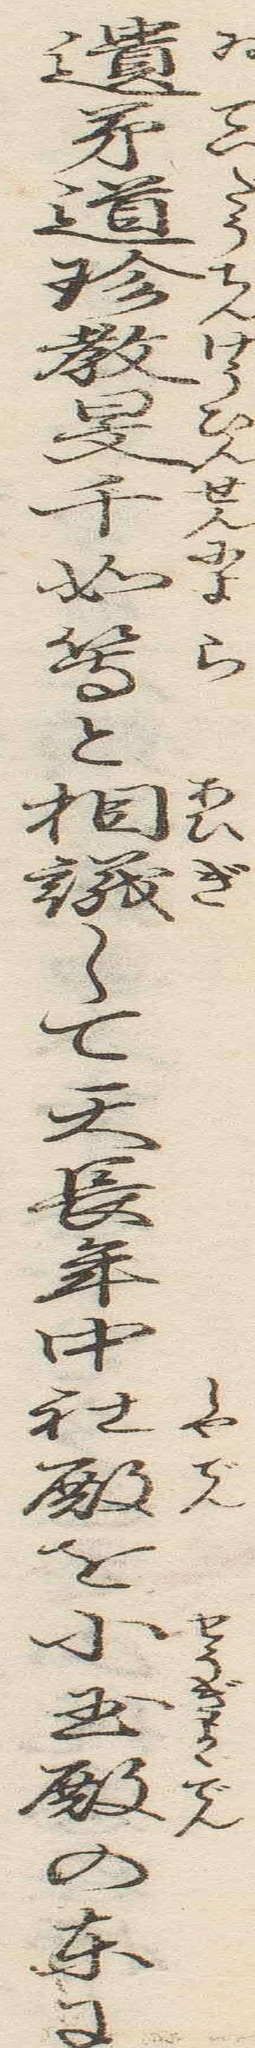遺㐧道珍敎旻千如等と相議して天長年中社殿を小玉殿の東に
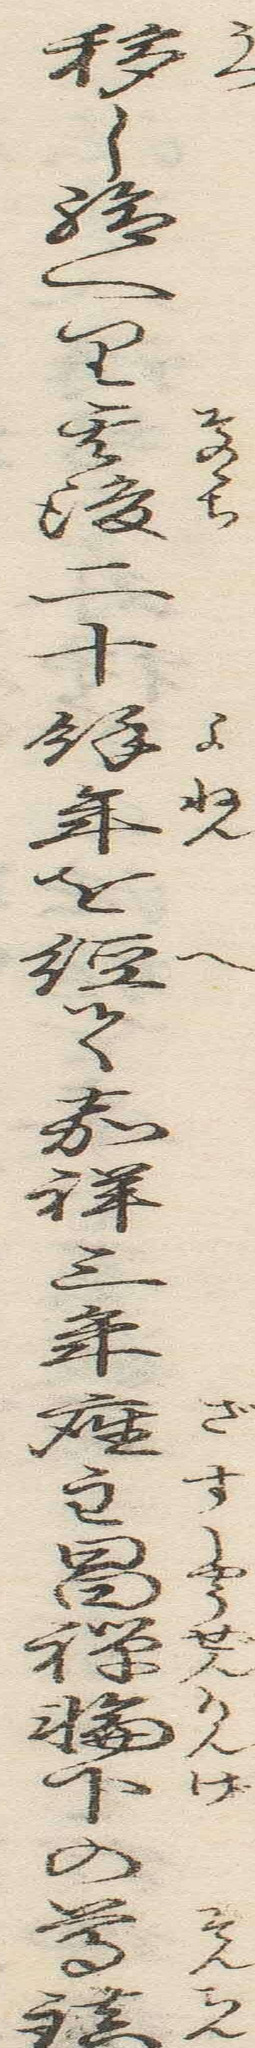移し給へり其後二十餘年を經て嘉祥三年座主昌禅輪下の尊鎮
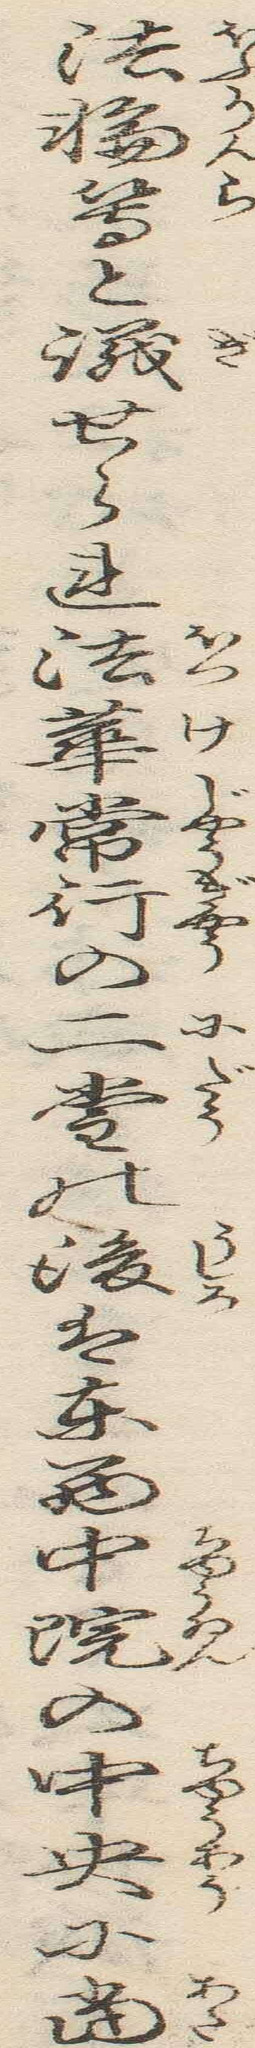法輪等と議せられ法華常行の二堂の後は東西中院の中央に當
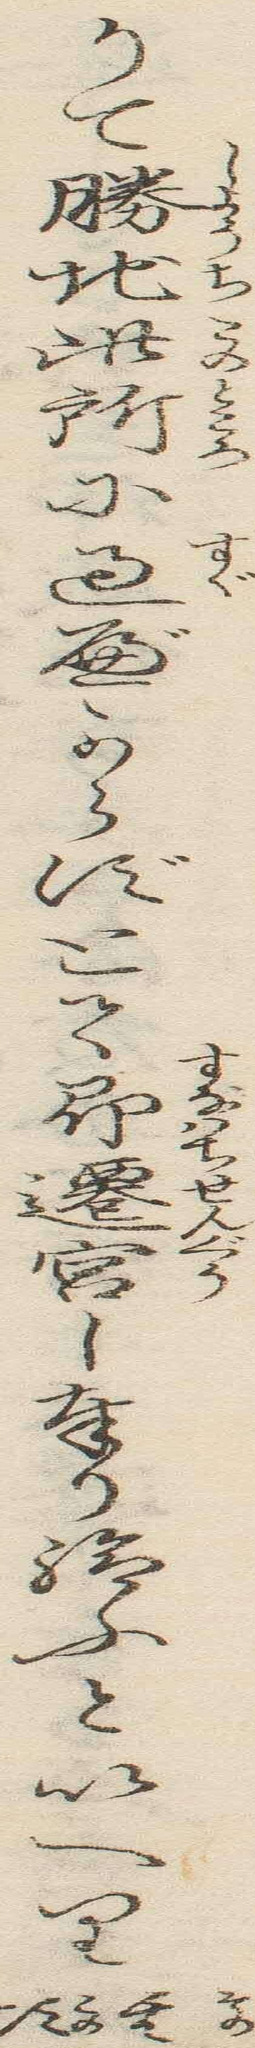りて勝地此所に過べからずとて即遷宮し奉り給ふといへり其頃
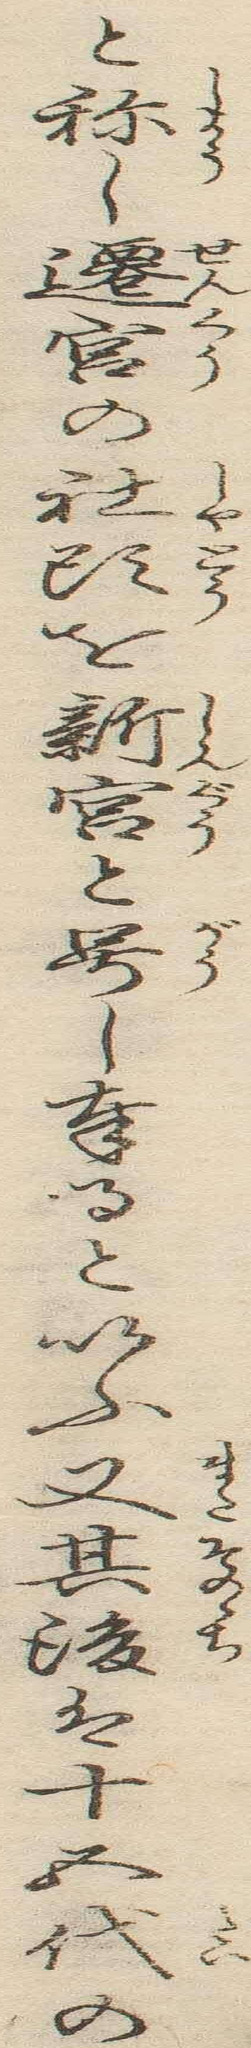と称し遷宮の社頭を新宮と号し奉るといふ又其後は十五代の

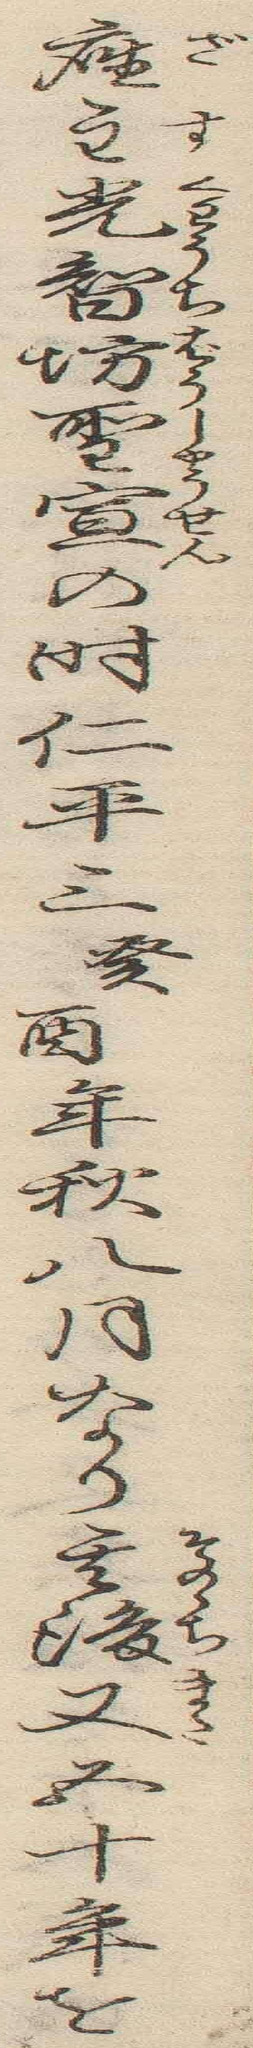座主光智坊聖宣の时仁平三癸酉年秋八月なり其後又五十年を
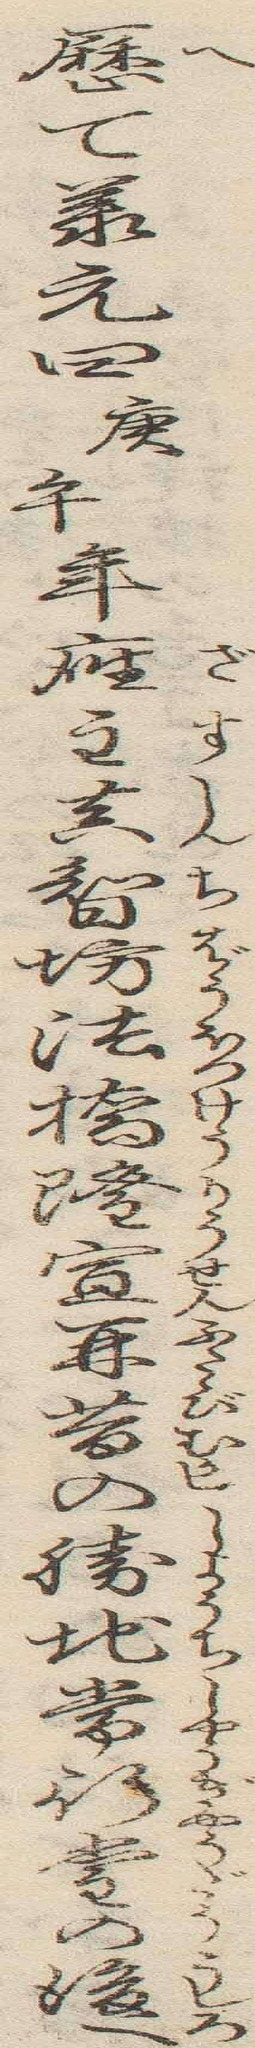歷て承元四庚午年座主真智坊法橋隆宣再昔の勝地常行堂の後へ
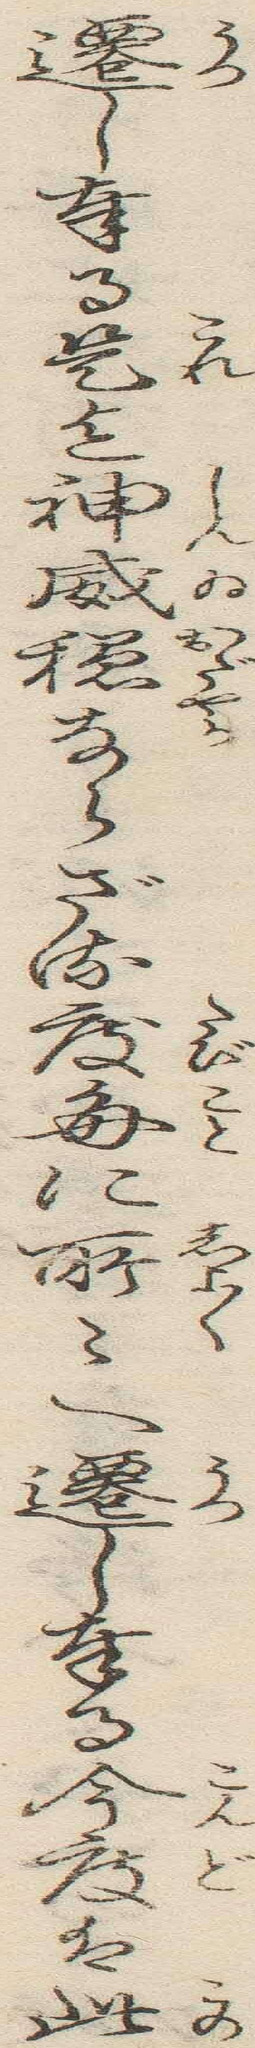遷し奉る是を神威穏ならざる度毎に所〻へ遷し奉る今度は此
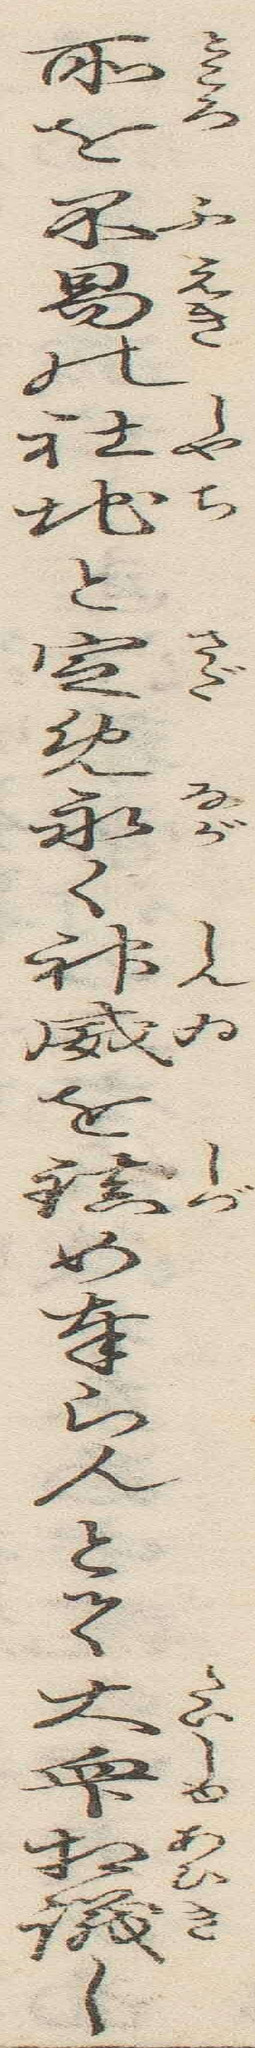所を不易な社地と定め永く神威を鎮め奉らんとて大衆相議し
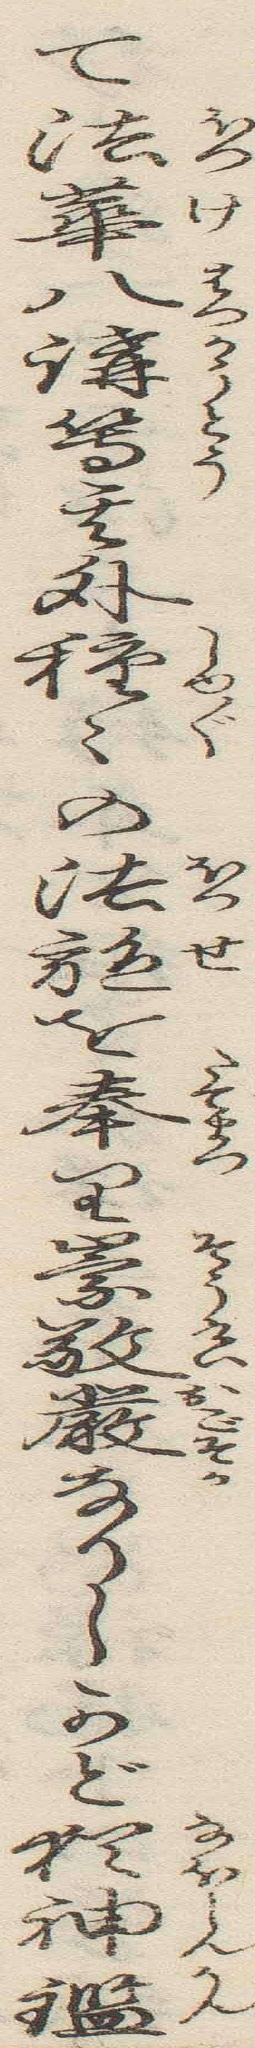て法華八講等其外種〻の法施を奉り崇敬嚴なりしかど猶神鑑
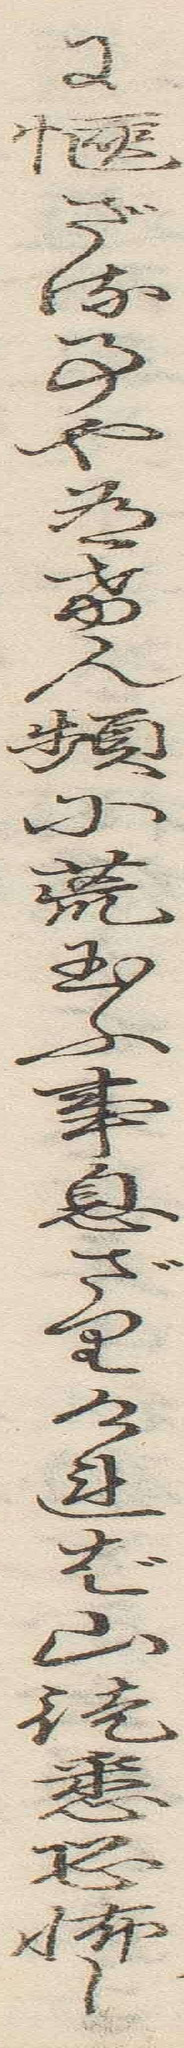に愜ざる事や有けん頻に荒玉ふ事息ざりければ山徒悉恐怖し
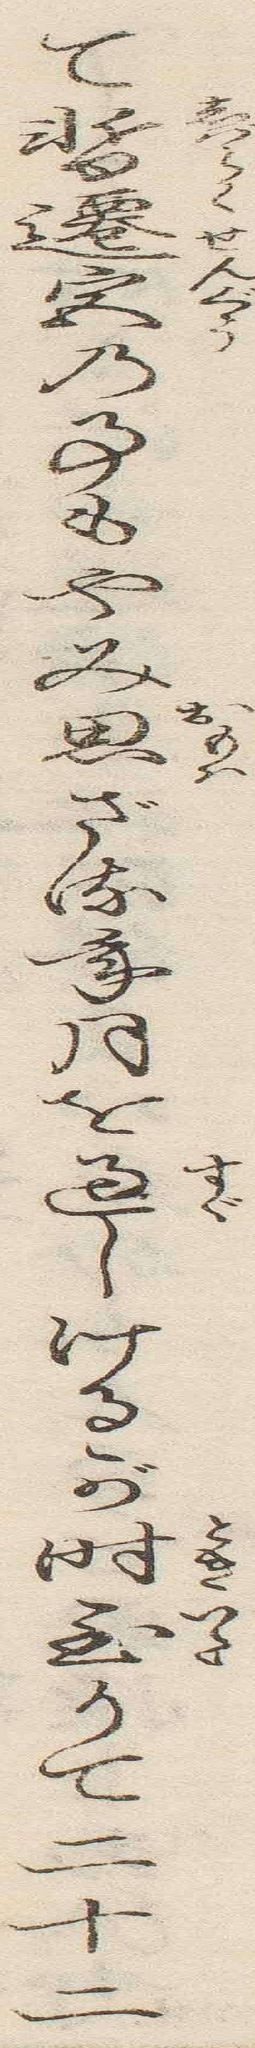て暫遷宮の事もやみ思ざる年月を過しけるが时至りて二十二
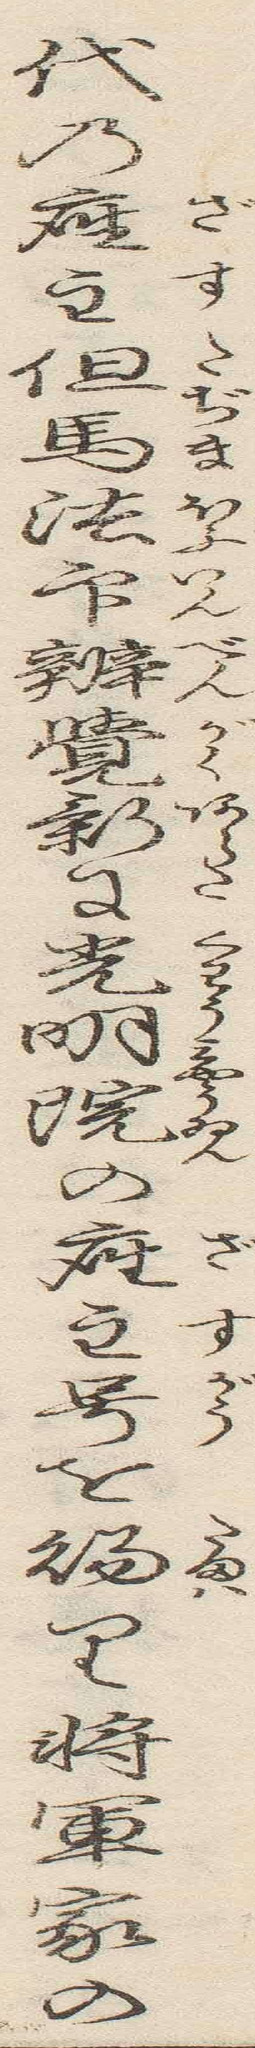代の座主但馬法印辨覺新に光明院の座主号を賜り将軍家の
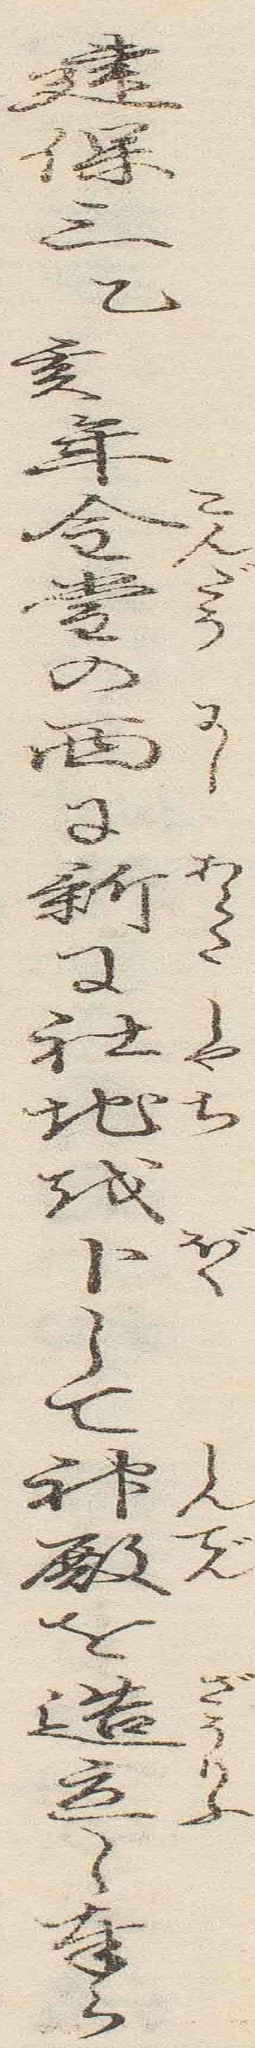建保三乙亥年金堂の西に新に社地を卜して神殿を造立し奉ら
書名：日光山志
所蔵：東京学芸大学附属図書館 国文学研究資料館
